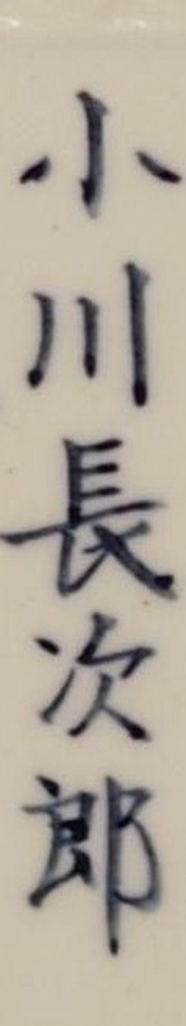小川長次郎
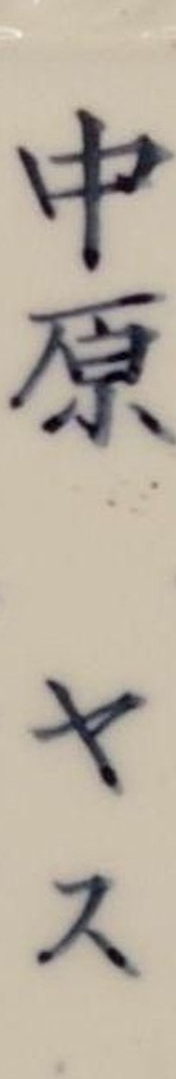中原ヤス
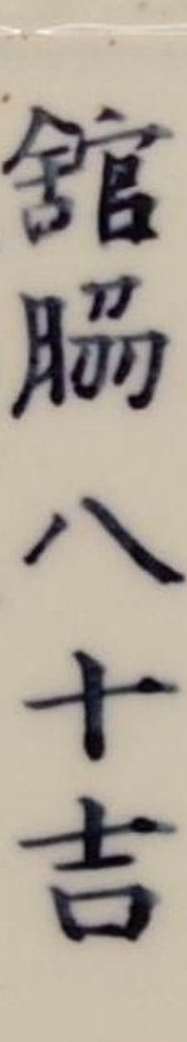館脇八十吉
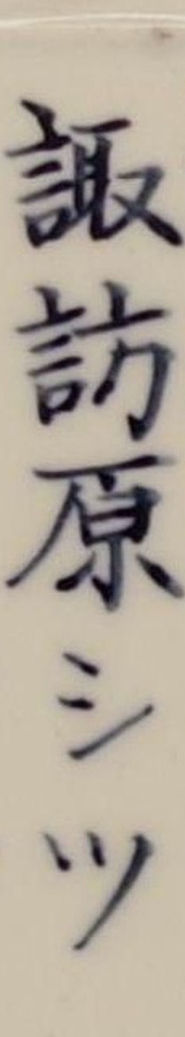諏訪原シツ
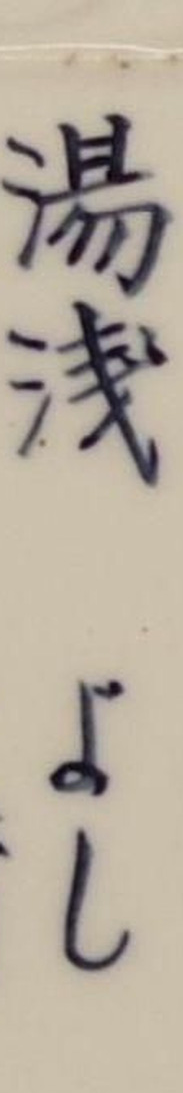湯浅よし
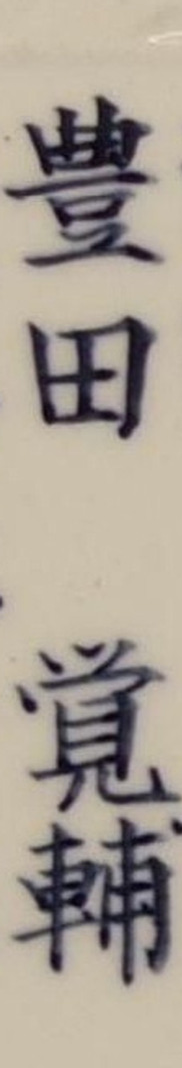豊田覚輔
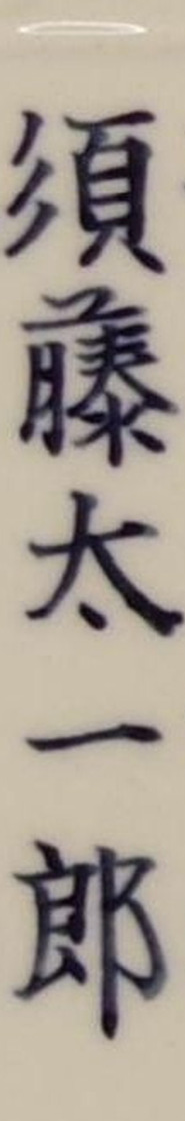須藤太一郎
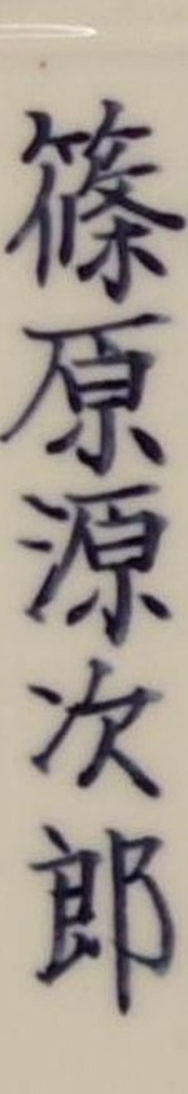篠原源次郎
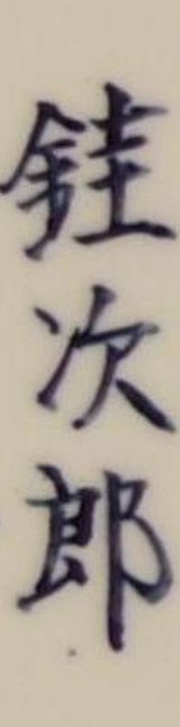金次郎
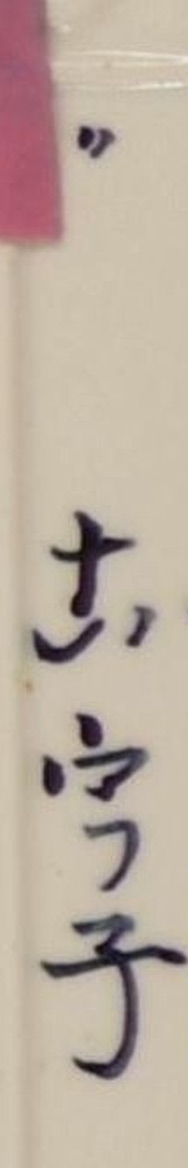こう子
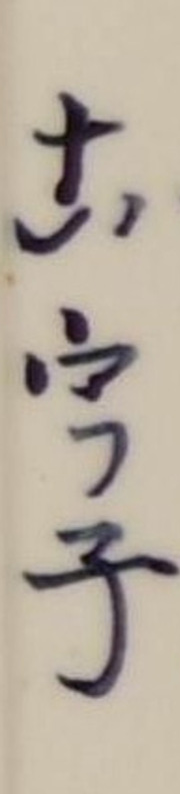こう子

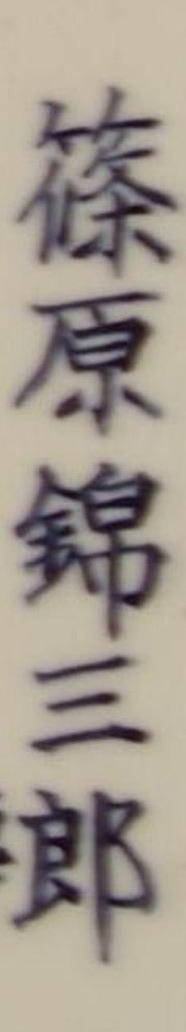篠原錦三郎
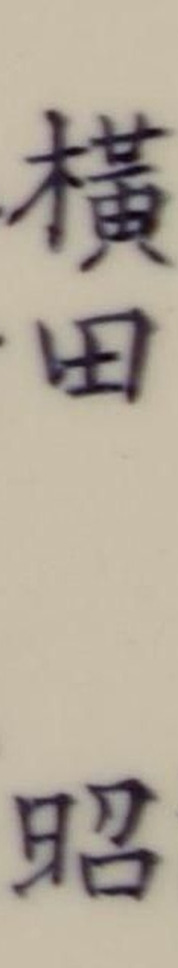横田昭
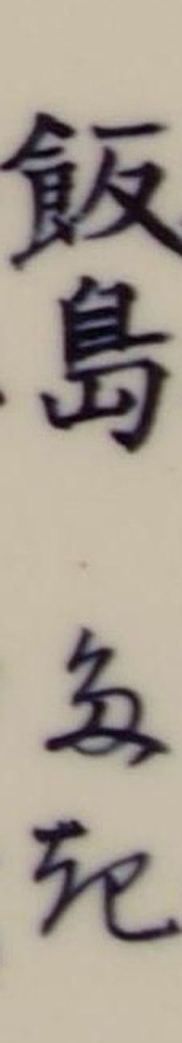飯島たき
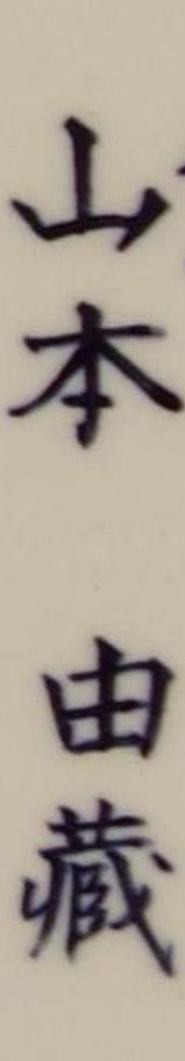山本由蔵
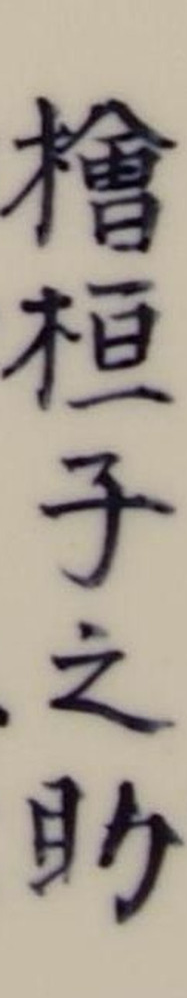檜桓子之助
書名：E~L
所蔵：高野山金剛峯寺
